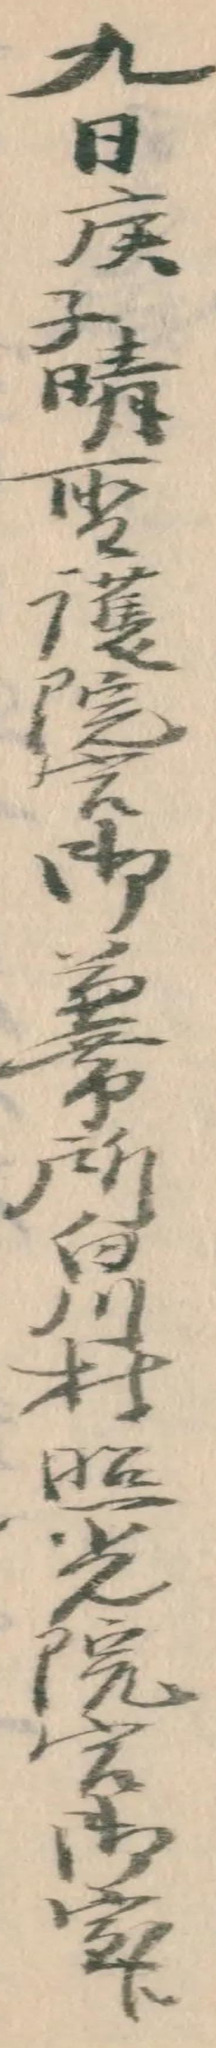九日庚子晴聖護院宮御兼常所白川村照光院宮御室え
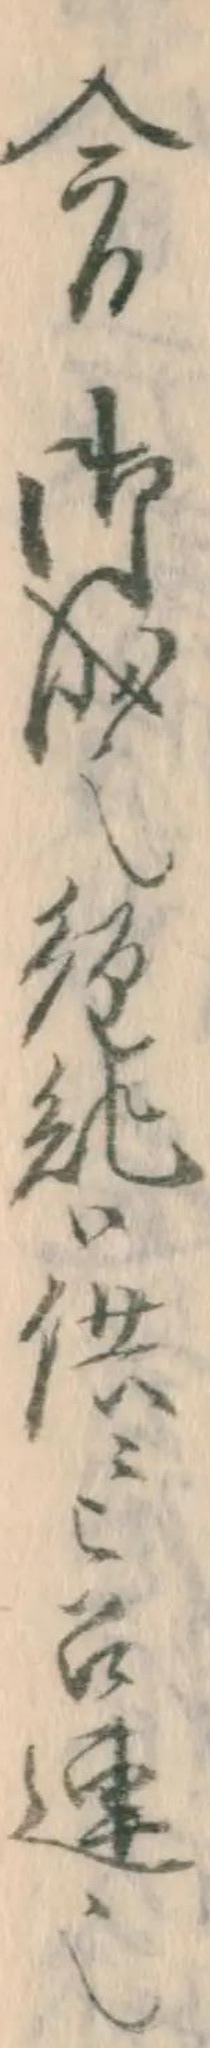今日御成也経紀御供云々召連也
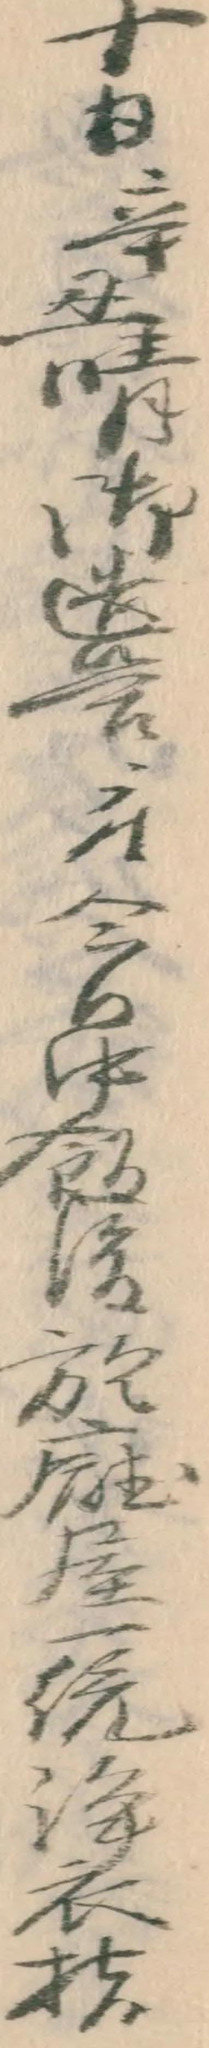十日辛丑晴御造営ニ付今日中飯後於廰屋一統浄衣指
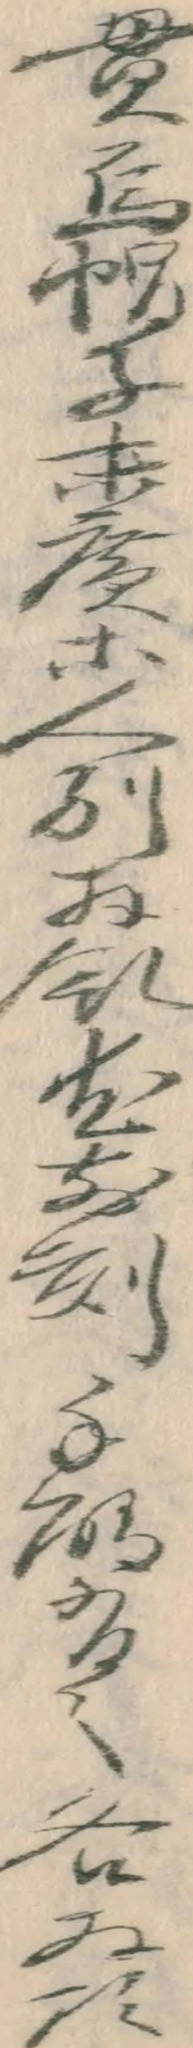貫烏帽子末廣等人別拝領尤前刻手觸有之各為預
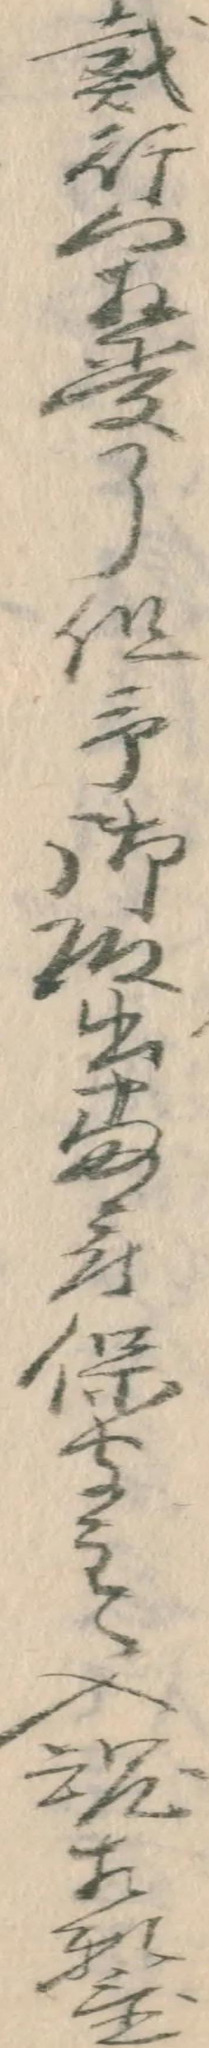裁行向相受了但予御殿出番ニ付保守主へ入魂相願置
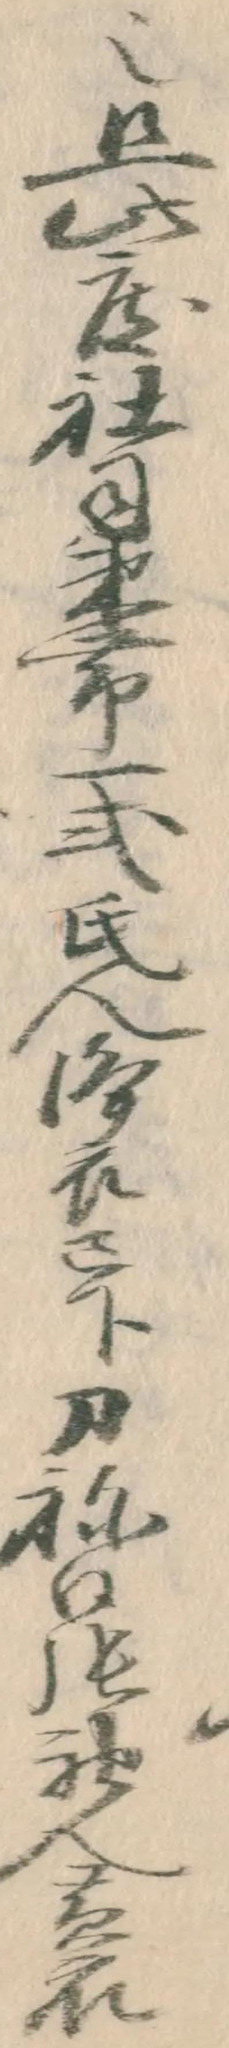也且此度社司束帯一式氏人浄衣已下刀祢白神人黄衣
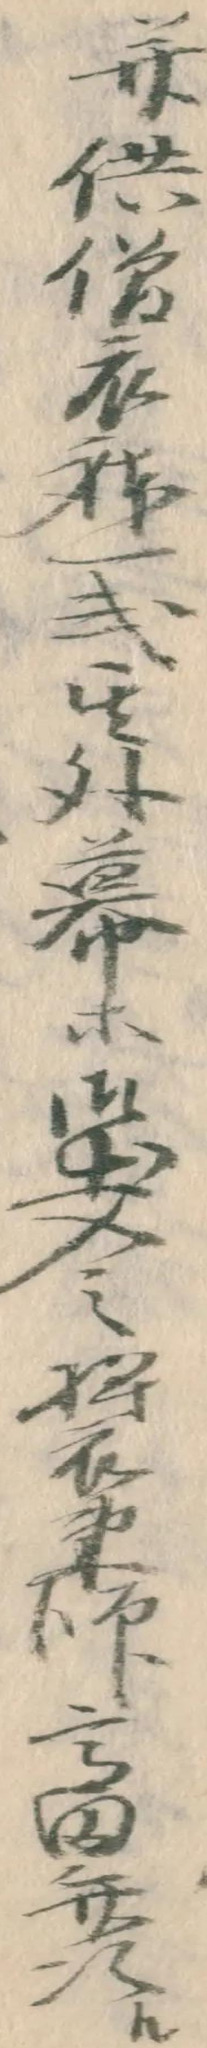幷供僧衣躰一式其外幕等御出入之装束師高田弁次え
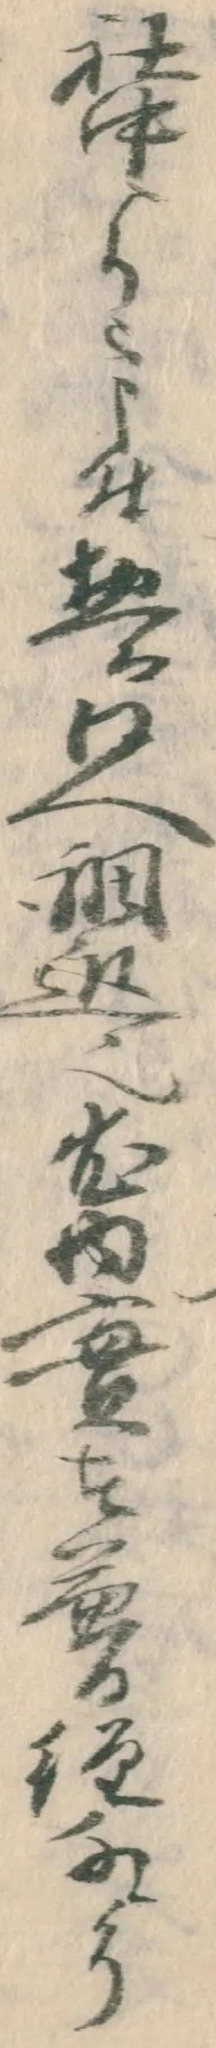社中より被申付惣而同人調進也尤内實者兼而経千より
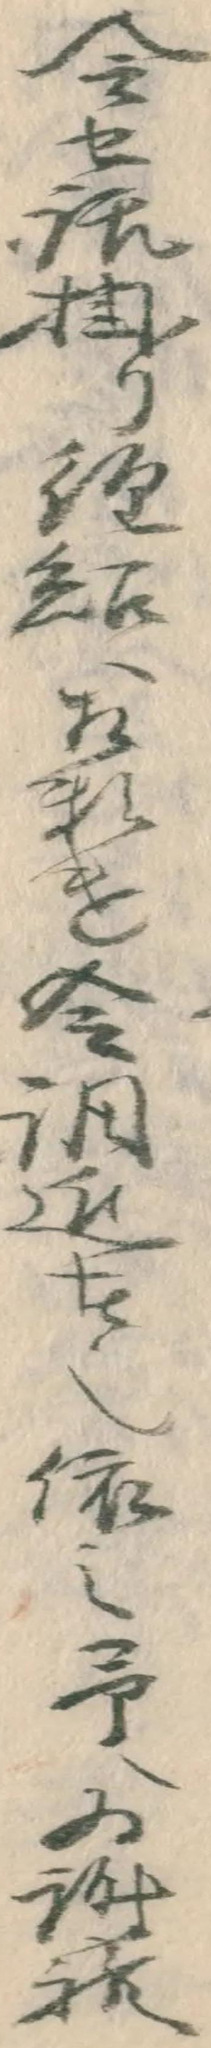令世話掛り経紹へ相頼遣令調近在也依之予へ為附礼
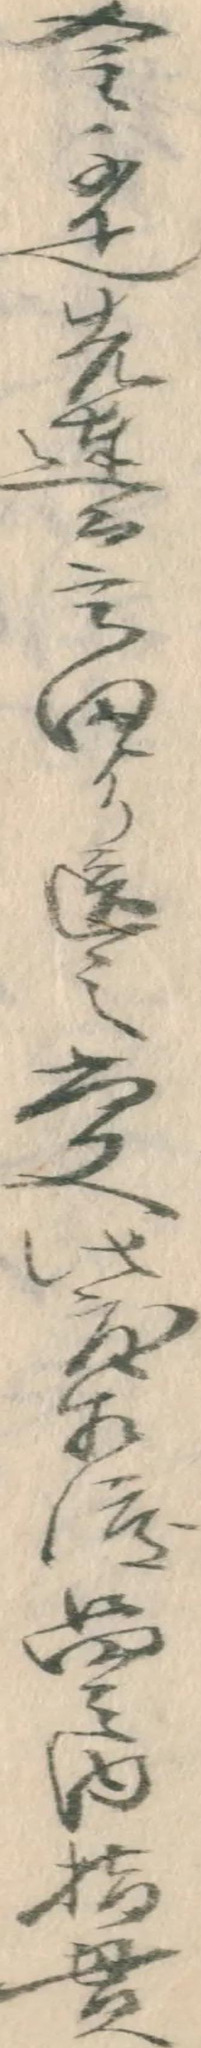金子疋先達而高田より送之尚又此度相渡品之内指貫
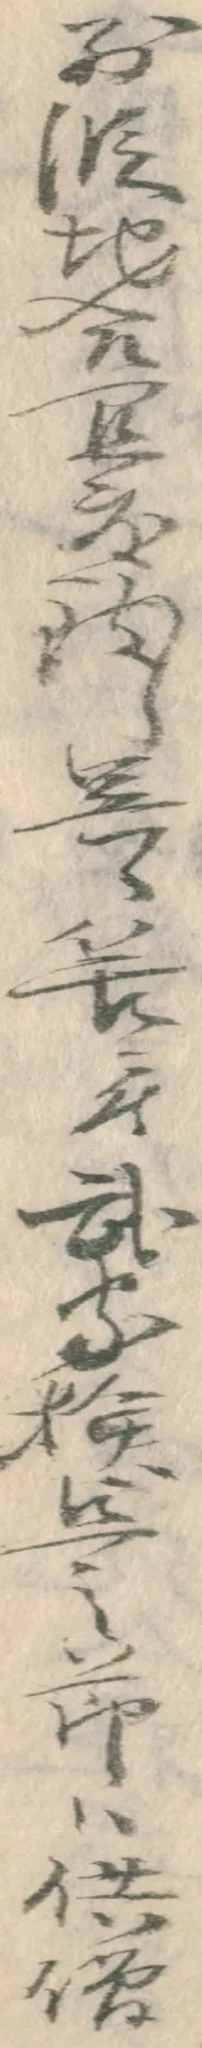別段地合宜敷致し呉候筈ニ付武家検旦之節ハ供僧
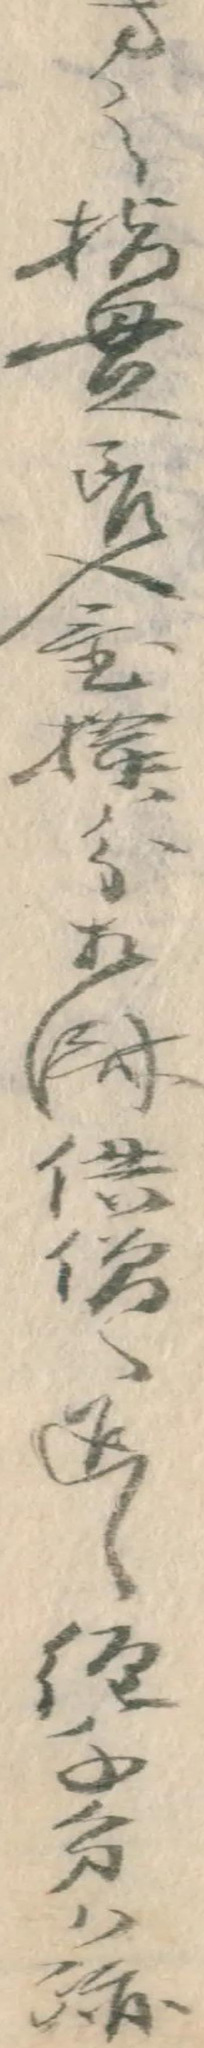方之指貫取入置検分相済供僧へ返し経千分ハ跡
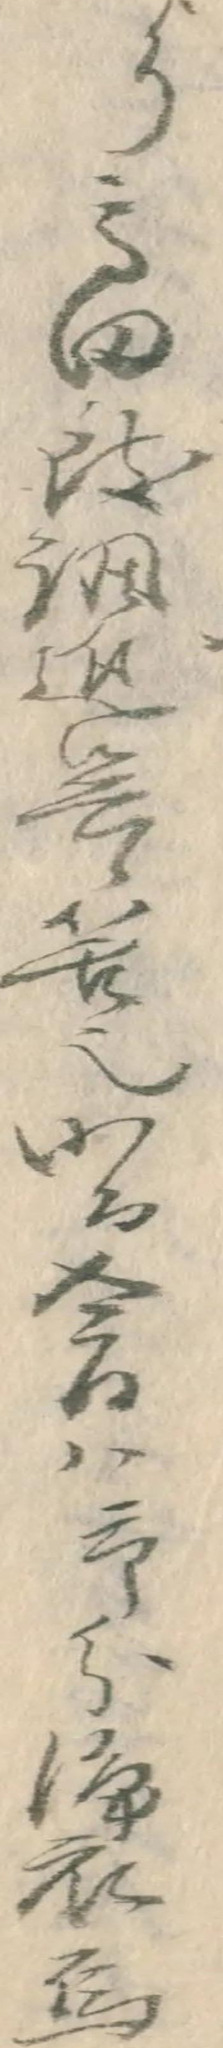より高田致調近呉候筈也仍而今日ハ予分浄衣焉

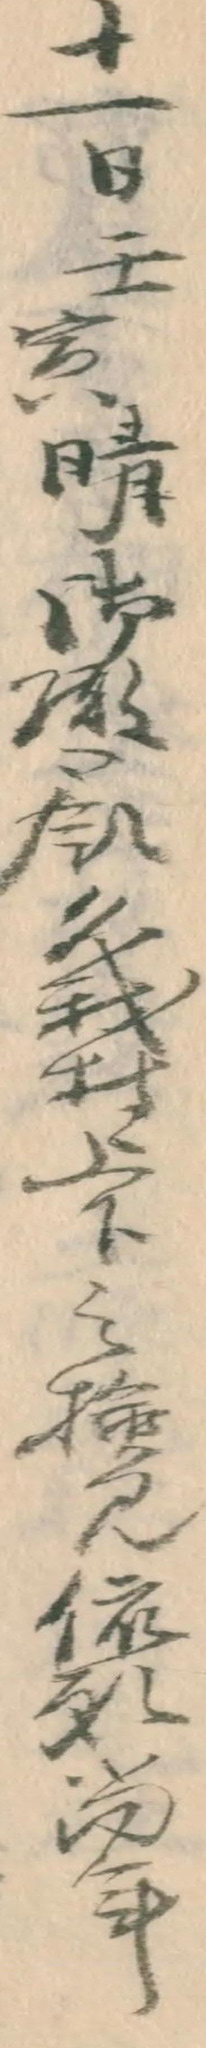十一日壬寅晴御殿御領久我村上下之検見依願當年
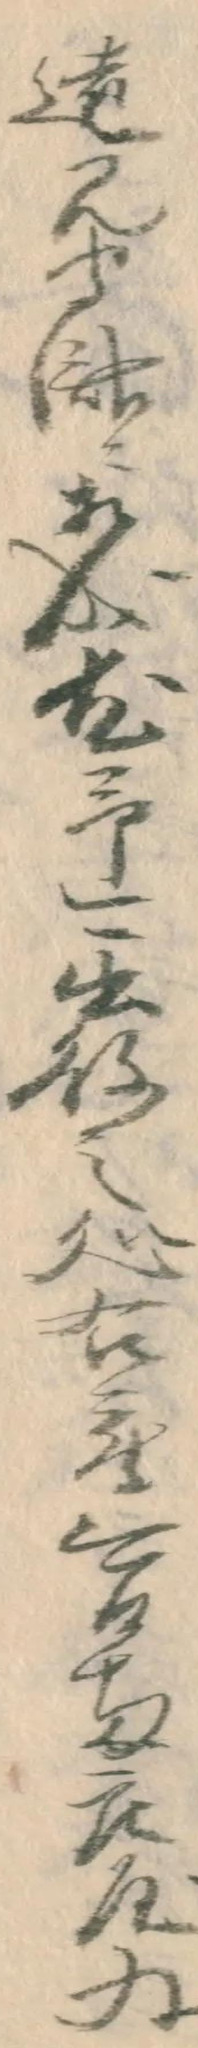遠見守済ニ相成尤予可出役之処右ニ付今日両庄屋為
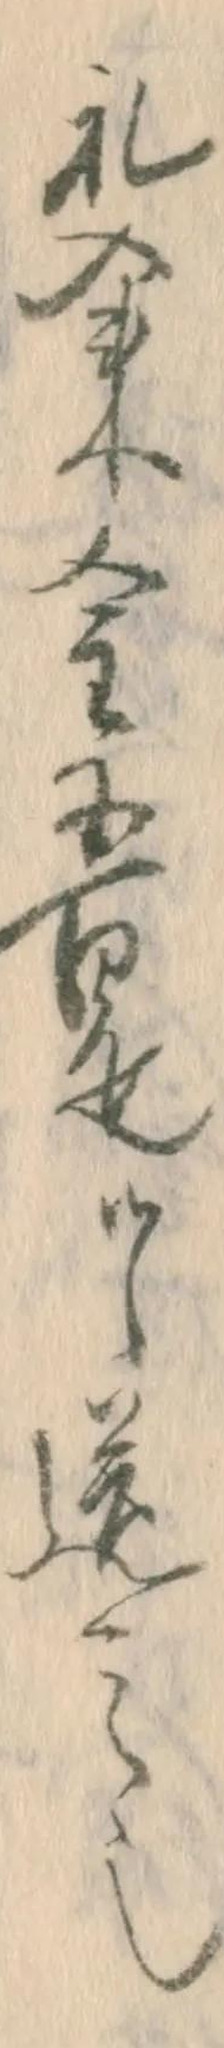礼入来金五百疋ツヽ送之也
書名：賀茂社記録. 第66冊
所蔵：国立国会図書館 National Diet Library, JAPAN
